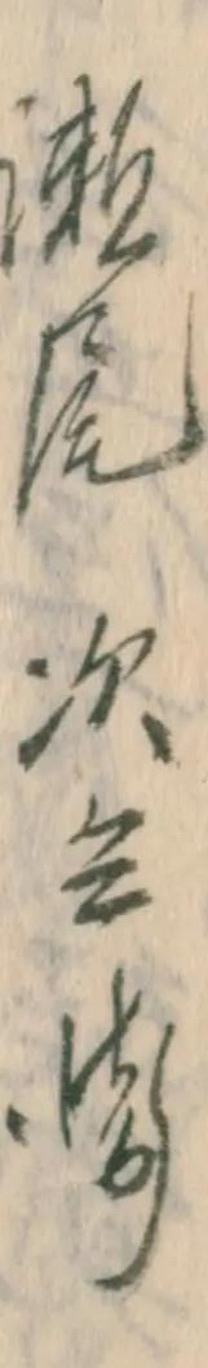瀬尾次兵衛
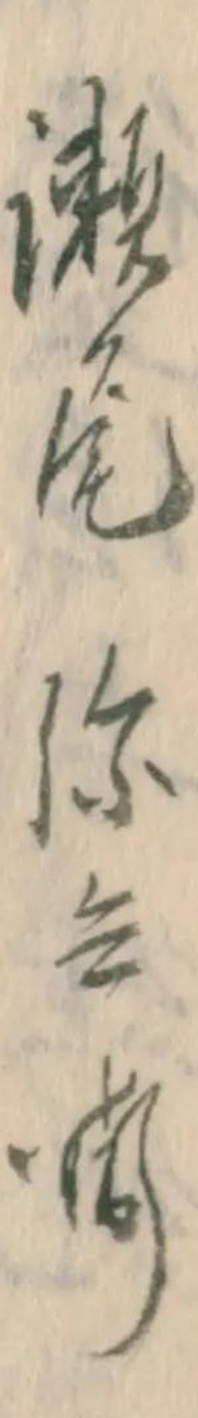瀬尾弥兵衛
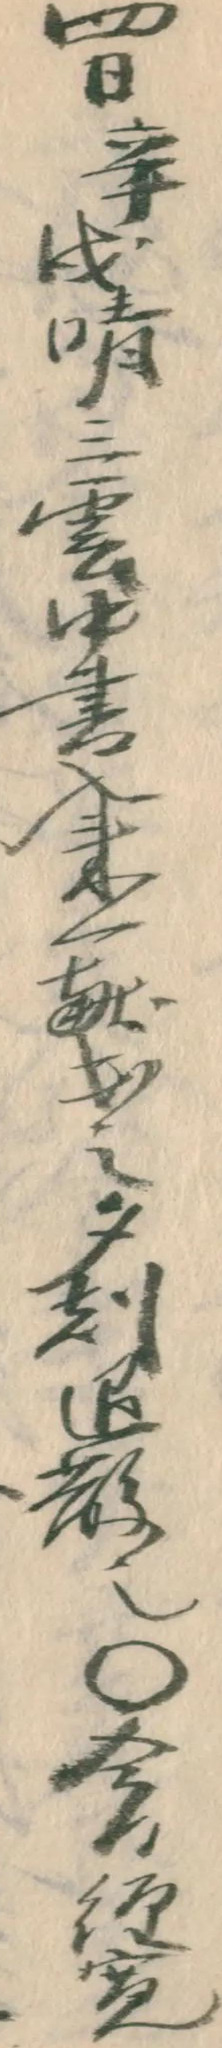四日辛戌晴三雲中書入来一献出之夕刻退散也○今日経寛
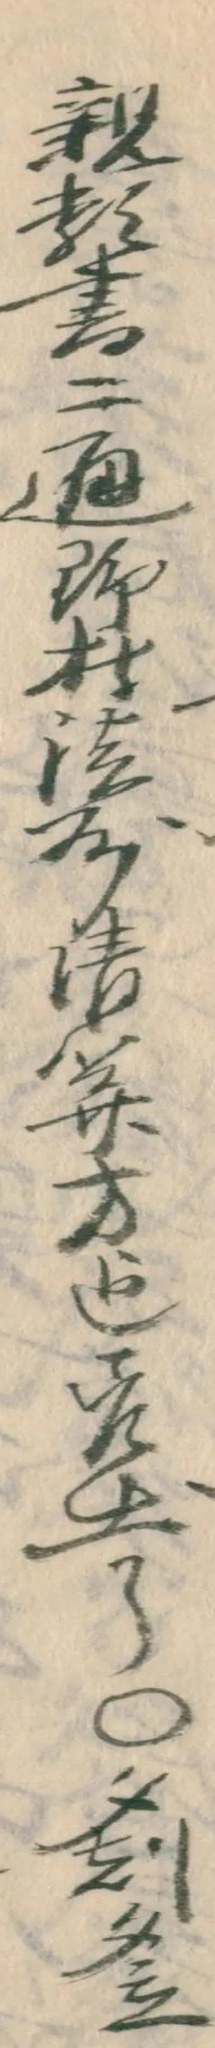親類書二通野村法印清算方迄差出了○夕刻夕立
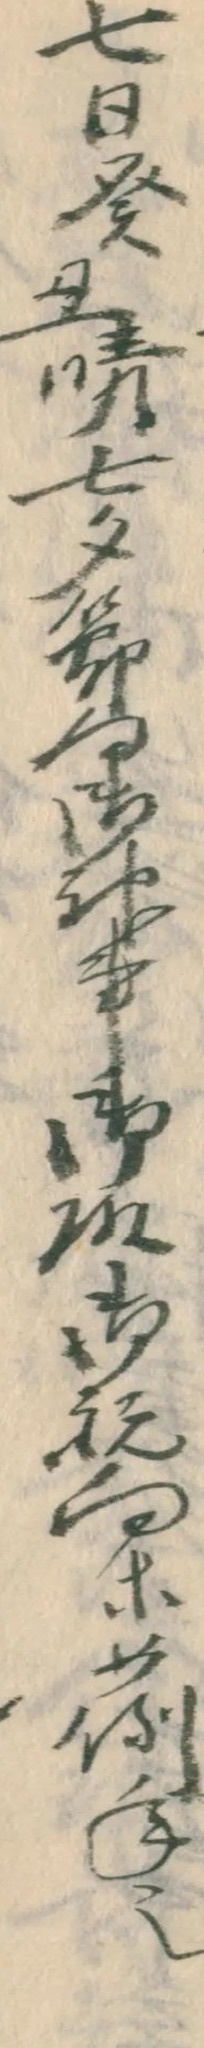七日癸丑晴七夕節句御神事御殿御祝向等如例年也
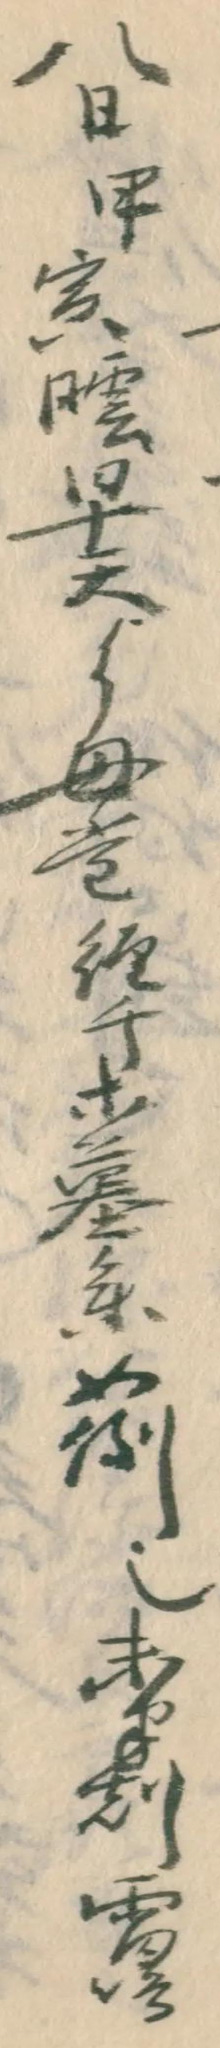八日甲寅曇早天より母堂経千等墓参如例也未半刻雷鳴
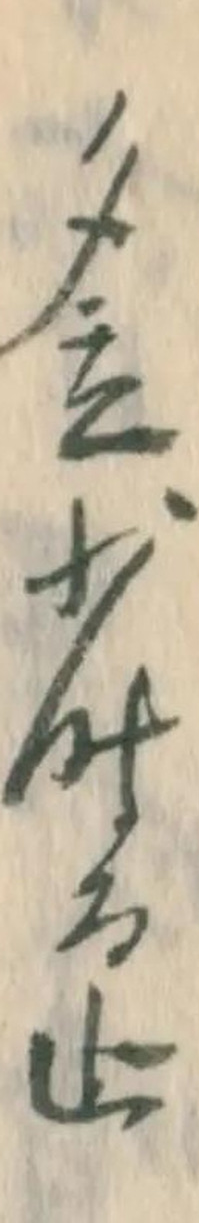夕立少時而止
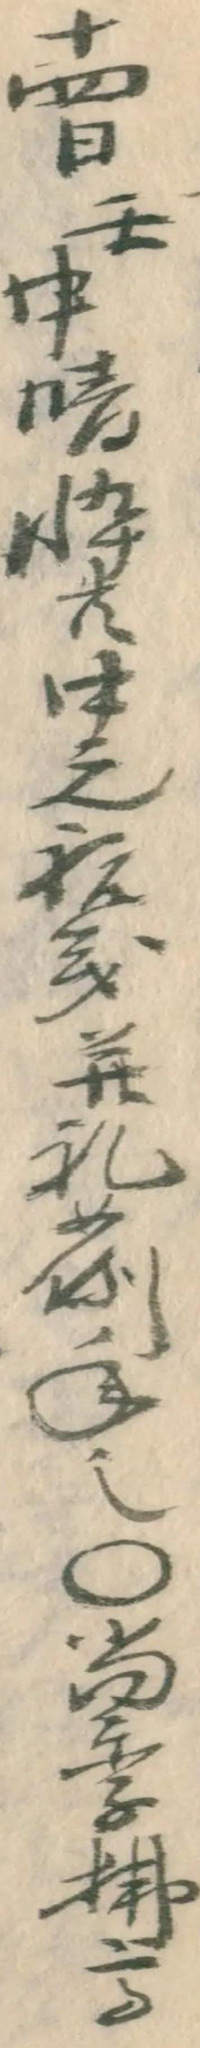十四日壬申晴忰共中元祝義并礼如例年也○當季払高
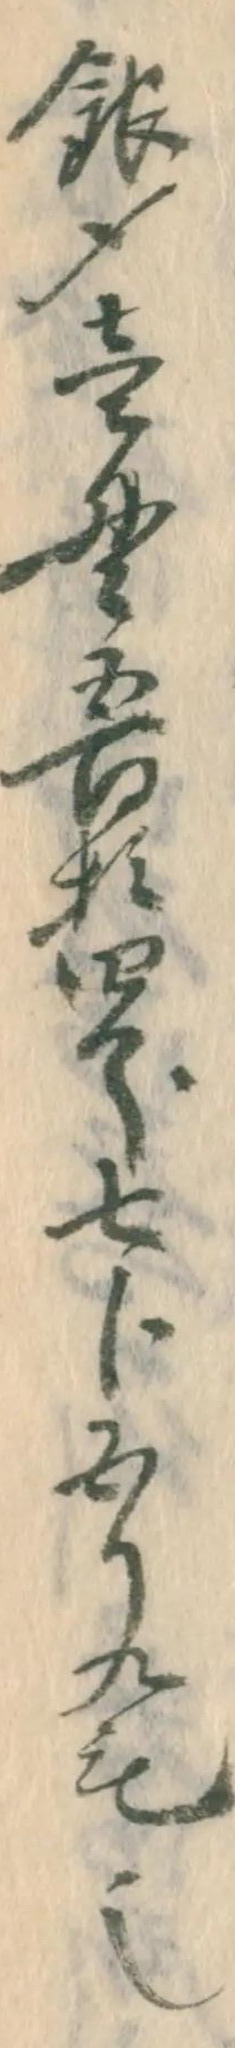銀〆壱貫五百拾四匁七分五り九毛也

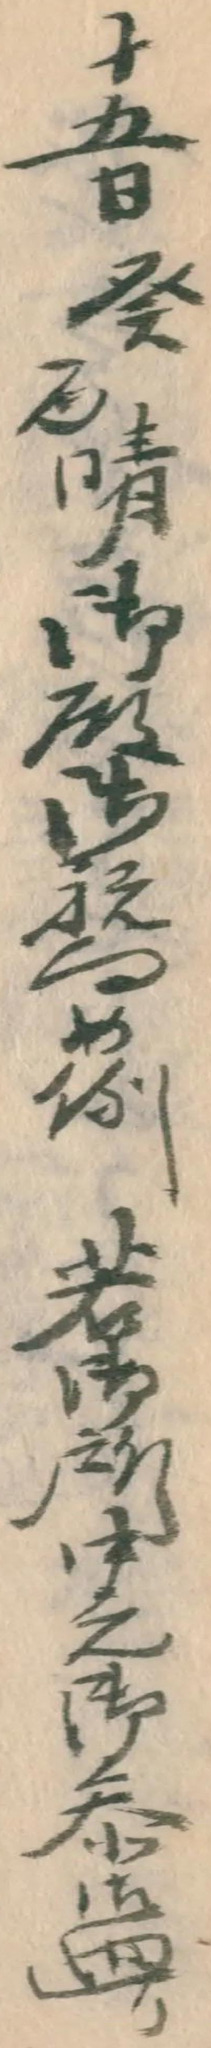十五日癸酉晴御殿御祝向如例若御所中元御参御廻り
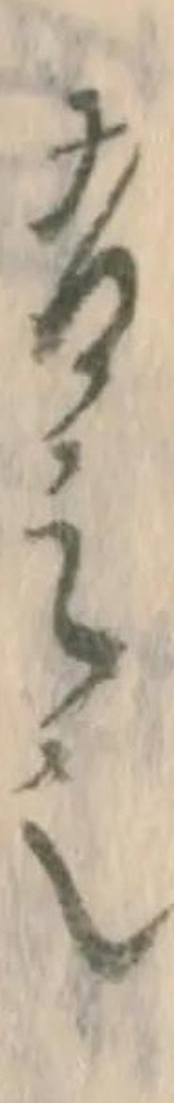有之也
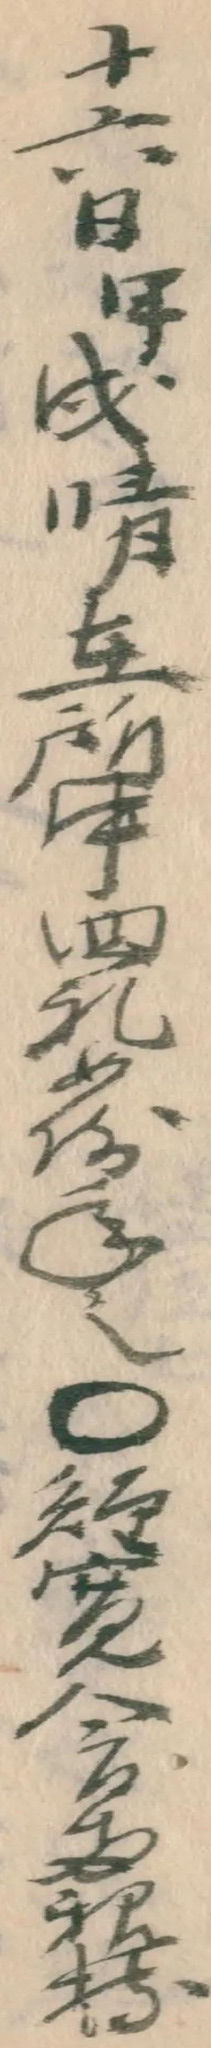十六日甲戌晴在所中回礼如例年也○経寛今日持
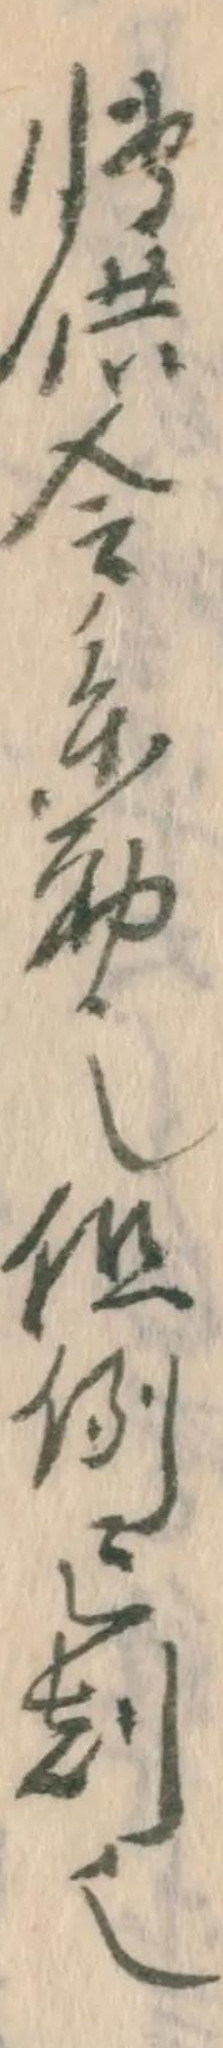轉供令参勤之但例巳刻也
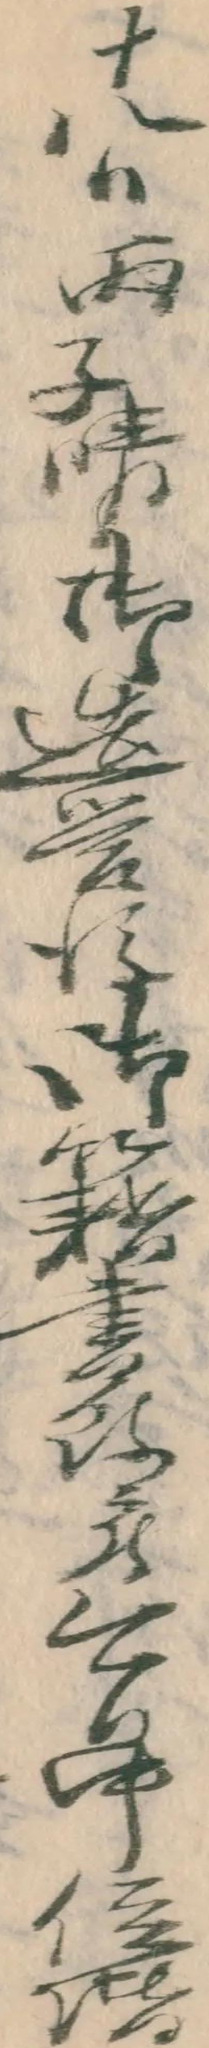十八日丙子晴御造営後御籍書改ニ付今日中位階
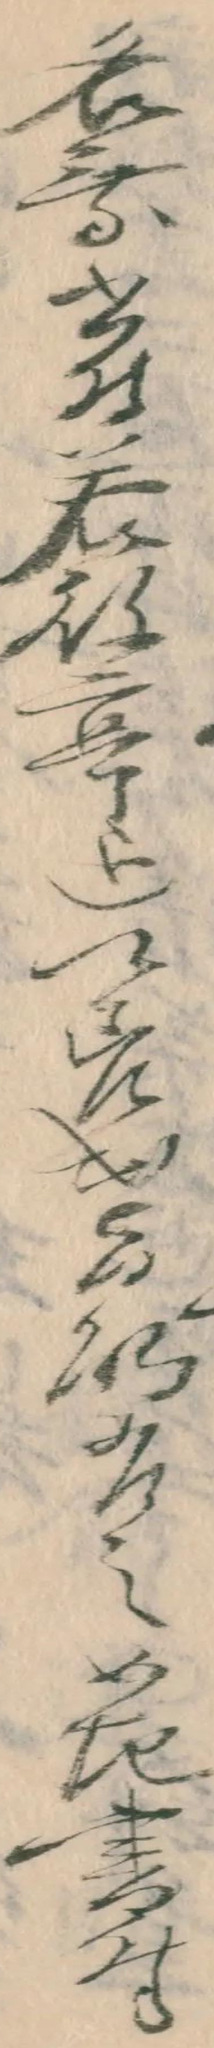名乗書付若役亭迄可差出旨觸有之如左書付
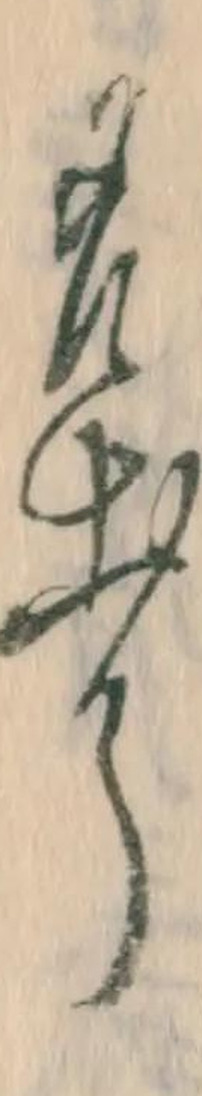差出了
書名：賀茂社記録. 第67冊
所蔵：国立国会図書館 National Diet Library, JAPAN
